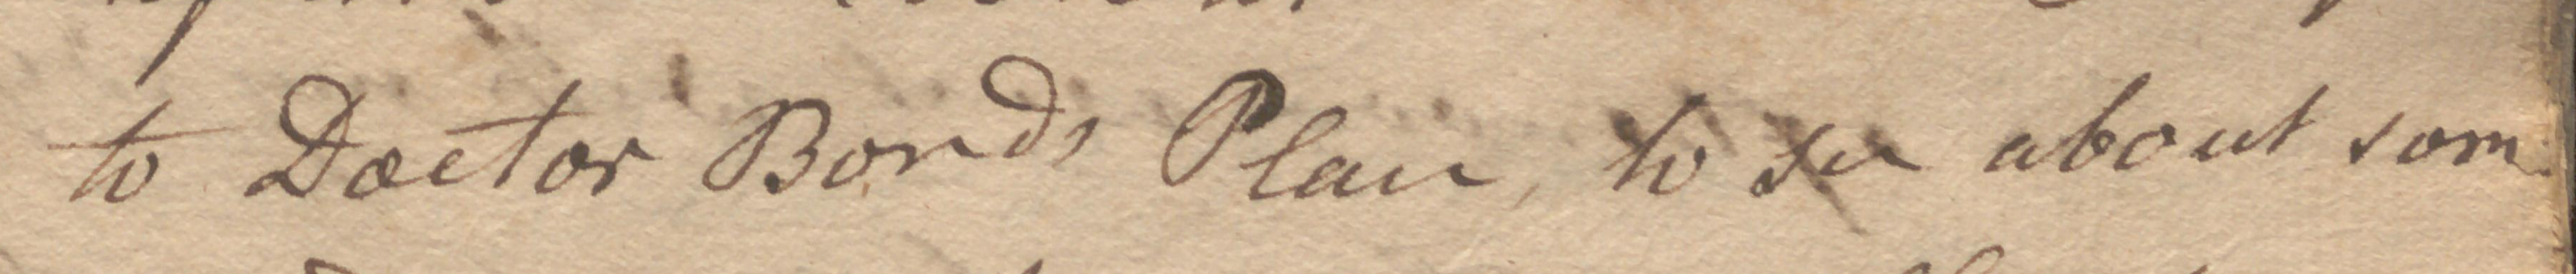to Doctor Bonds Place, to dee about som
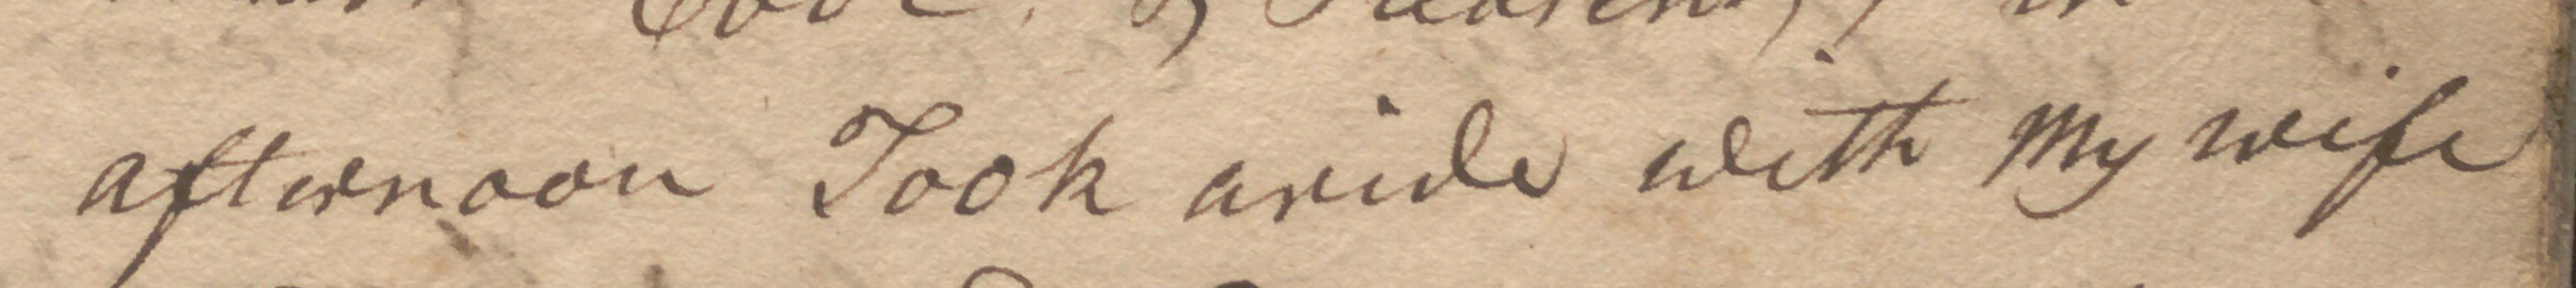afternoon Took a ride with my wife
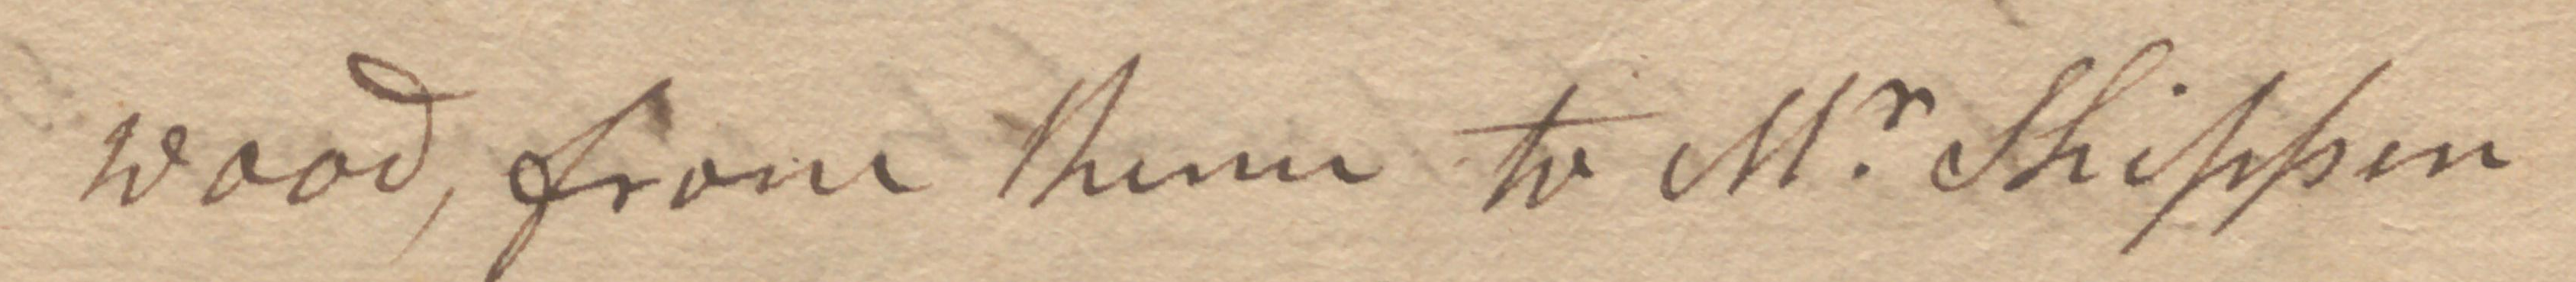wood, fron thence to M^r. Shippen
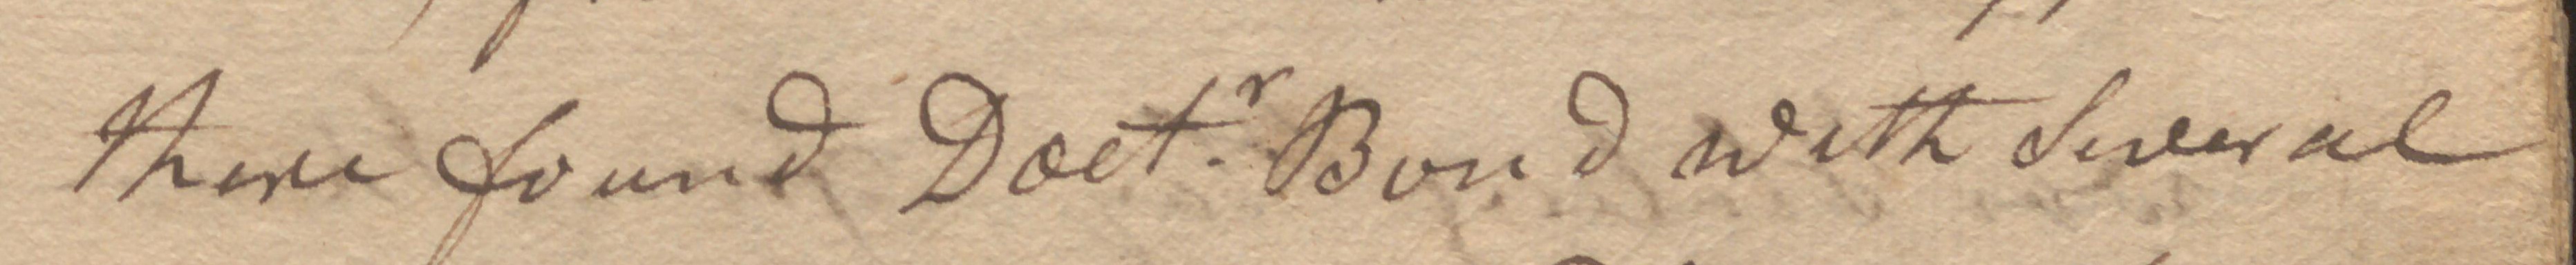there found Doct^r. Bond with Several
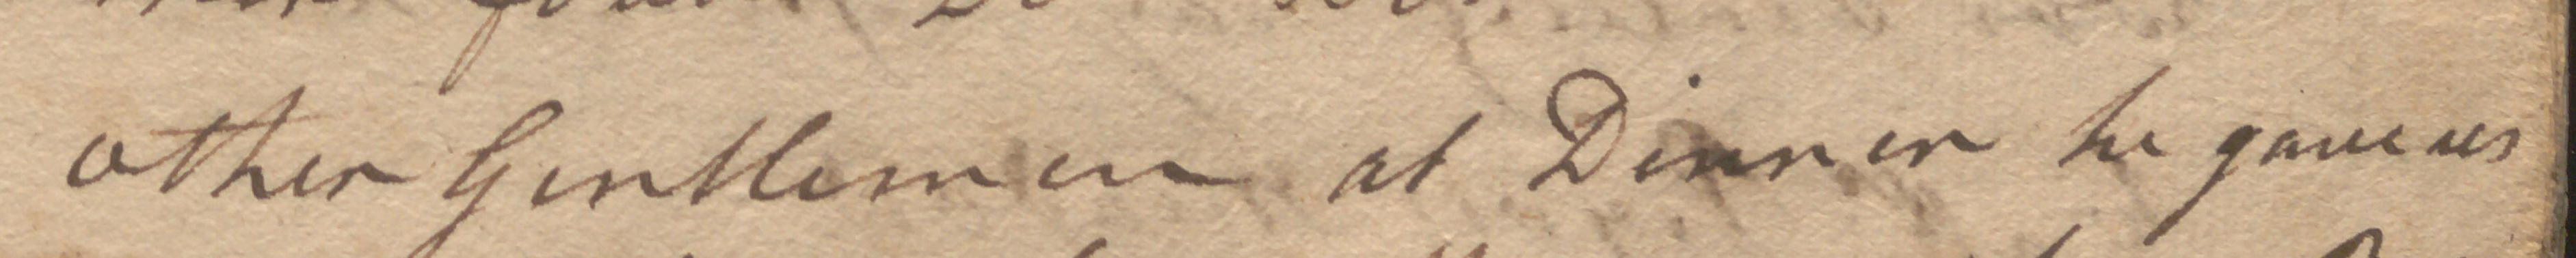other Gentlemen at Dinner he gave us
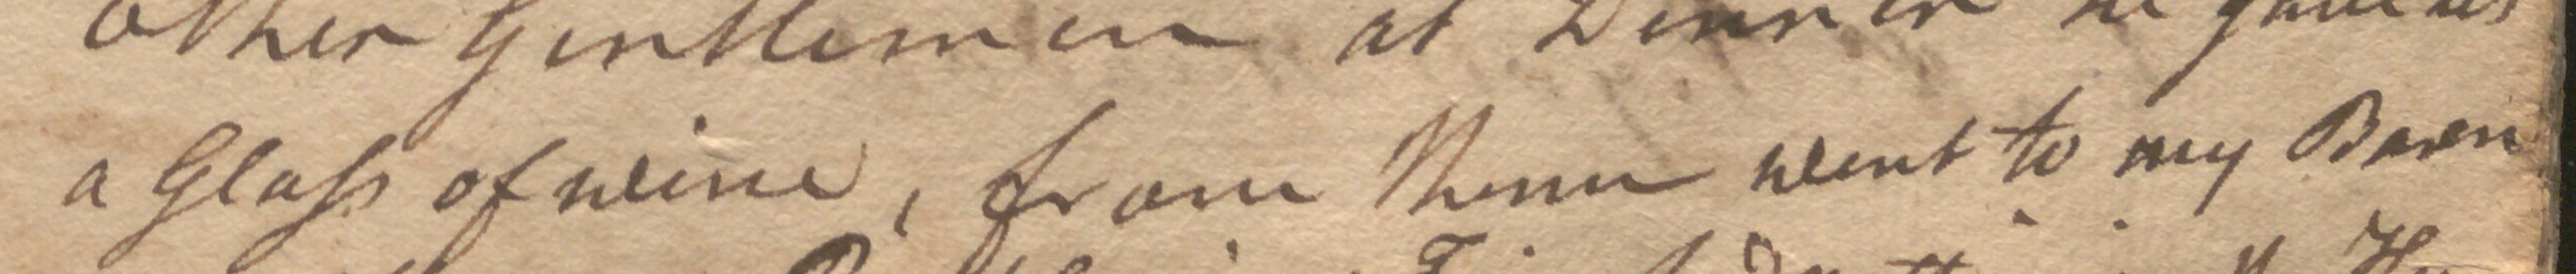a Glass of wine, from thence went to my Barn
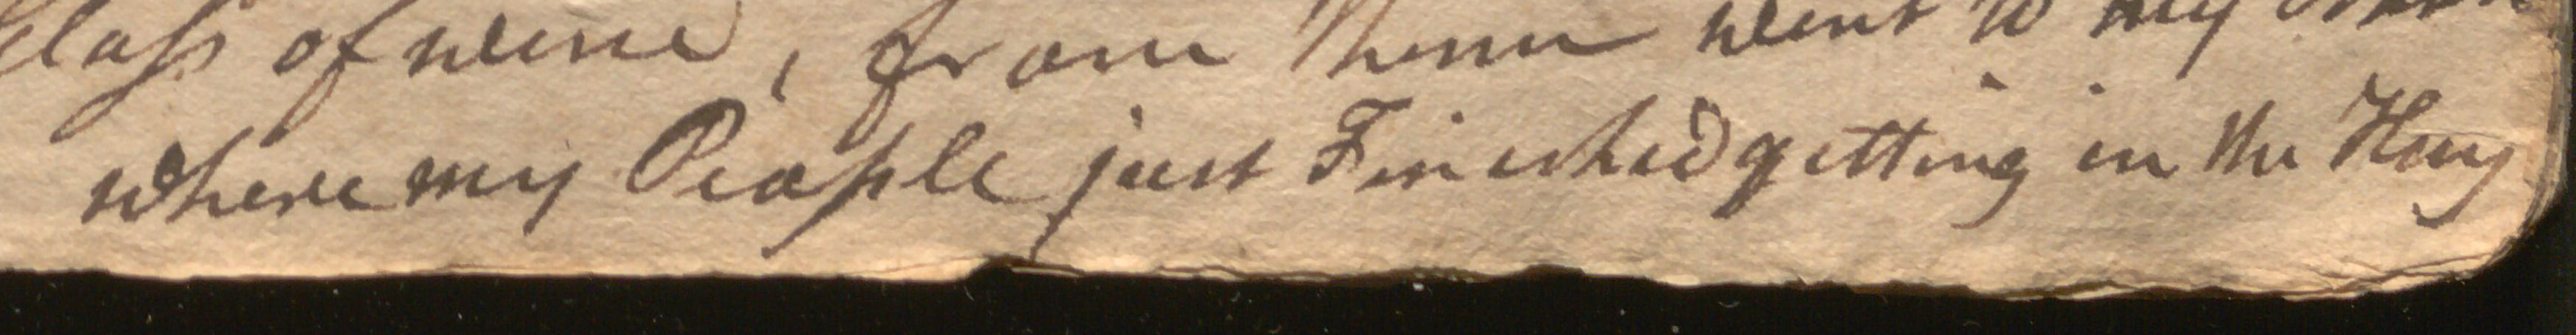where my People Just Fineshed getting in the Hay
